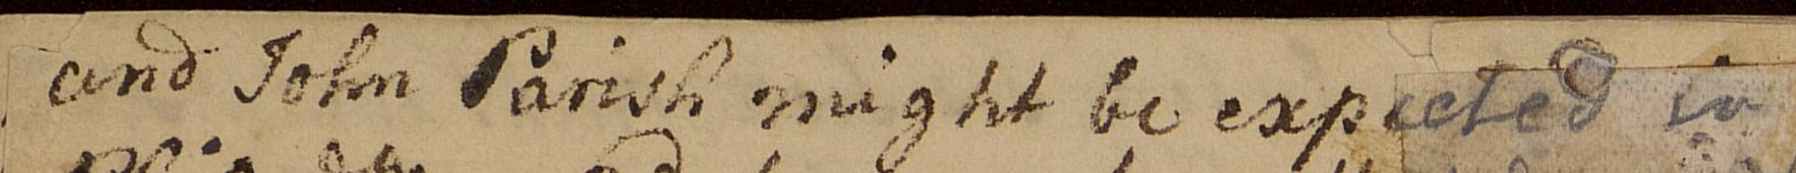and John Parish might be expected to
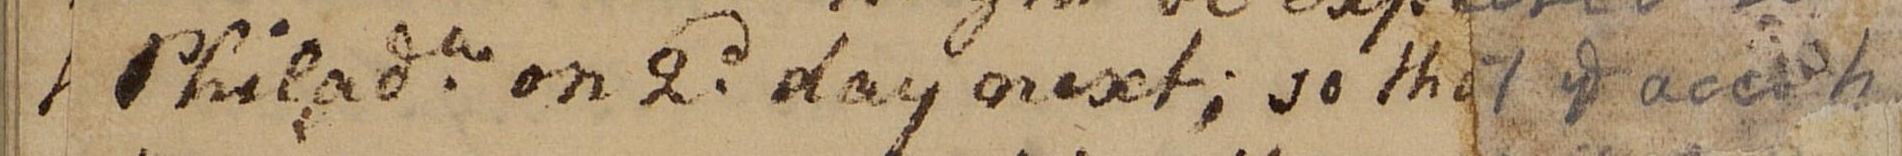Philad^a. on 2^d. day next; so that y^e acco^t
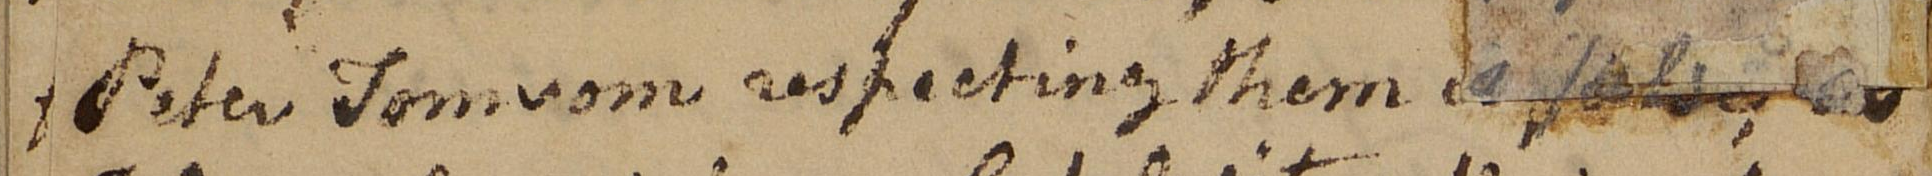Peter Samsom respecting them is [_____]
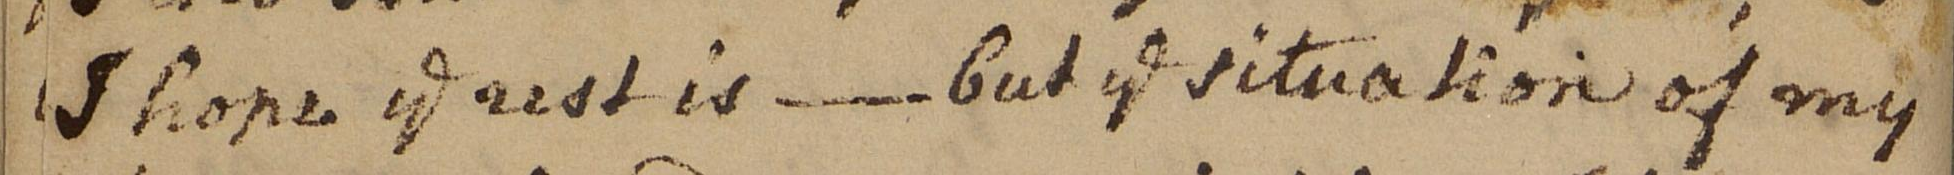I hope y^e rest is- but y^e situation of my
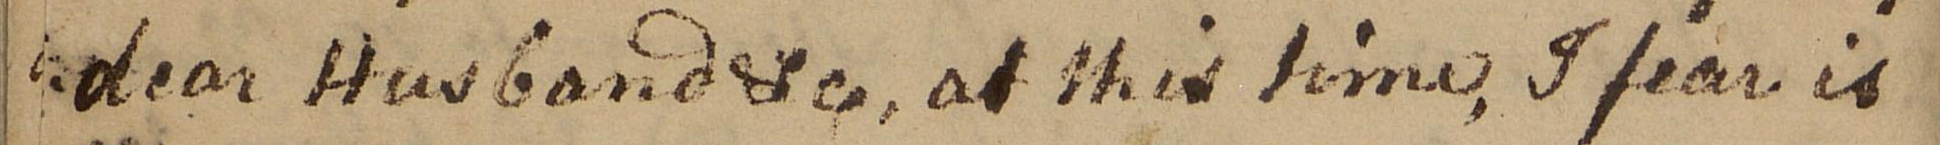dear Husband &c, at this time, I fear is
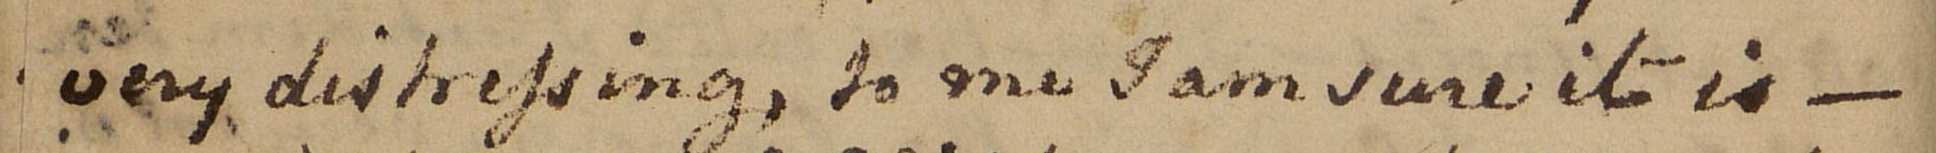very distressing, to me I am sure it is-
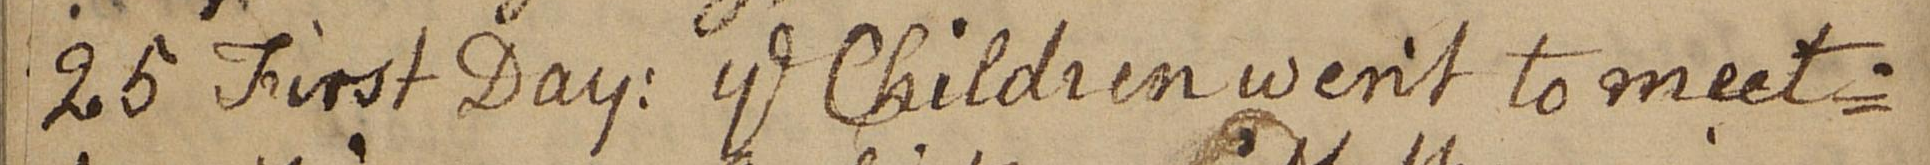25 First Day: y^e Children went to meet-
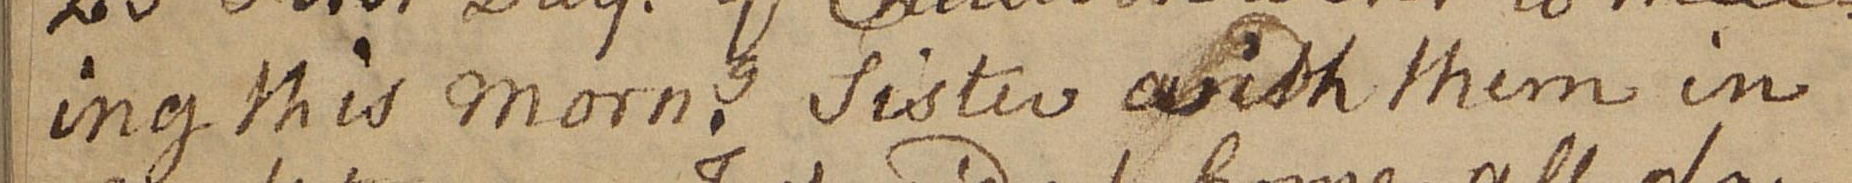ing this Morn^g. Sister with them in
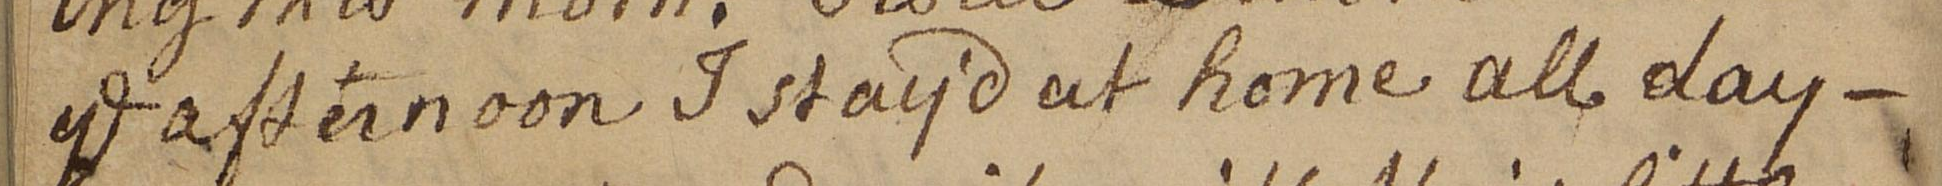y^e afternoon I stay'd at home all day-
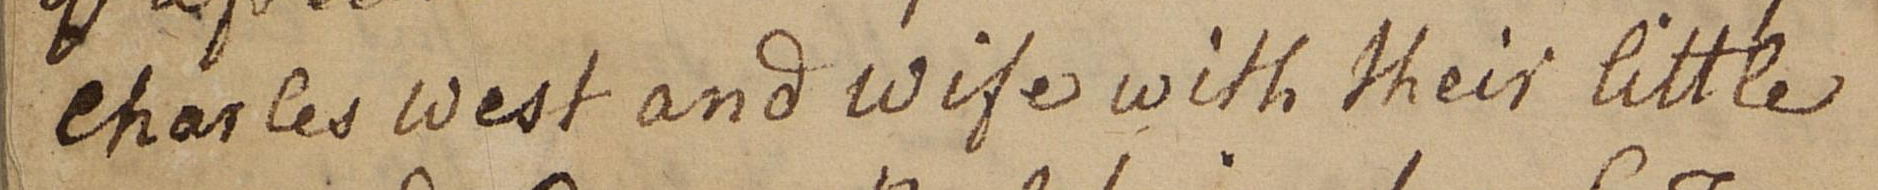Charles West and Wife with their little
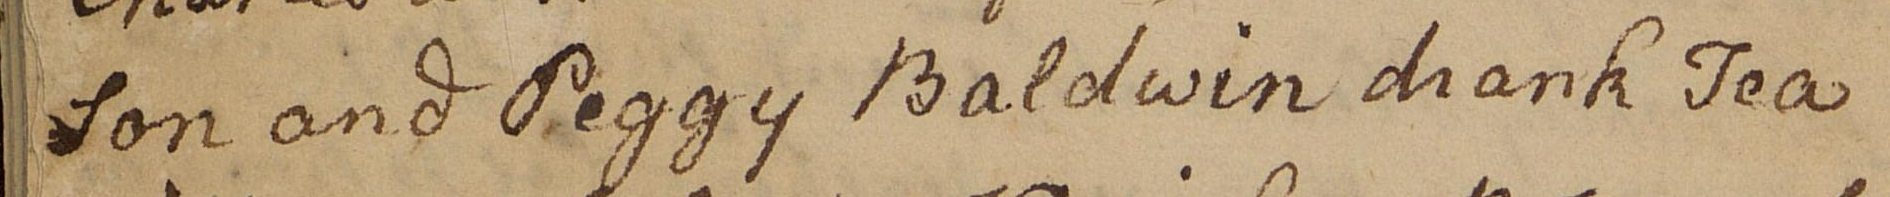Son and Peggy Baldwin drank Tea
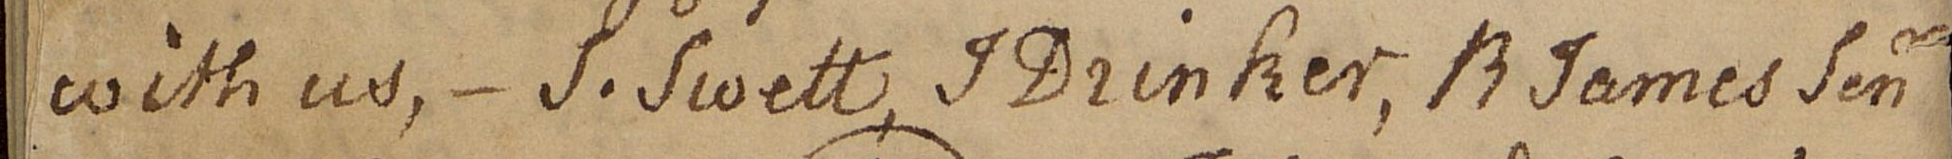with us,- S. Swett, I Drinker, R James Sen^r
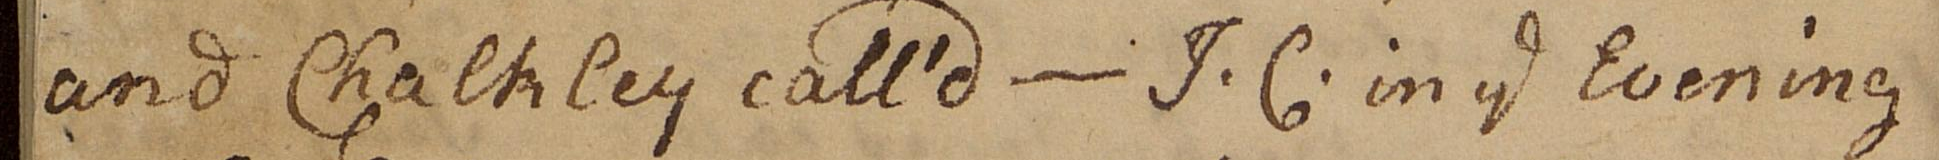and Chalkley call'd- I.C. in y^e Evening
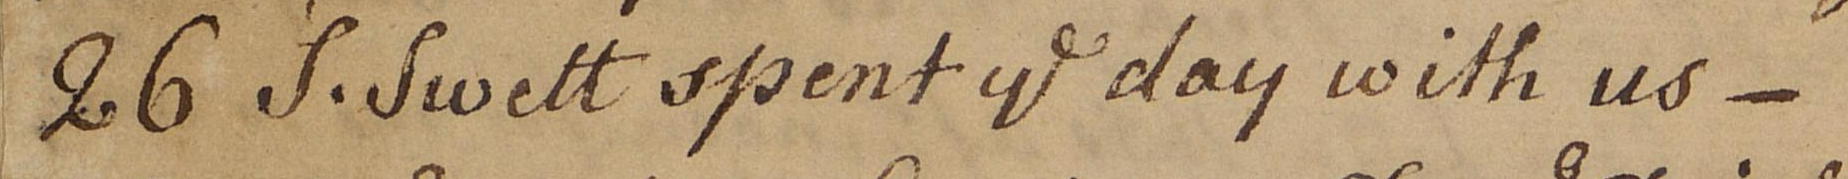26 S. Swett spent y^e day with us-
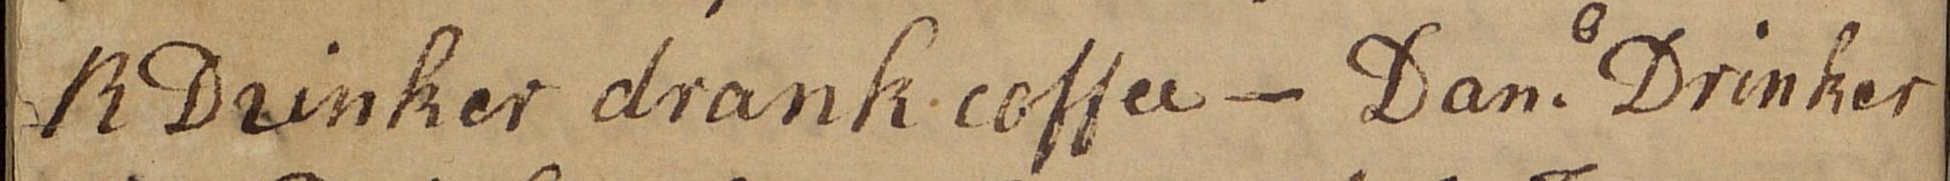R Drinker drank coffee- Dan^l. Drinker
